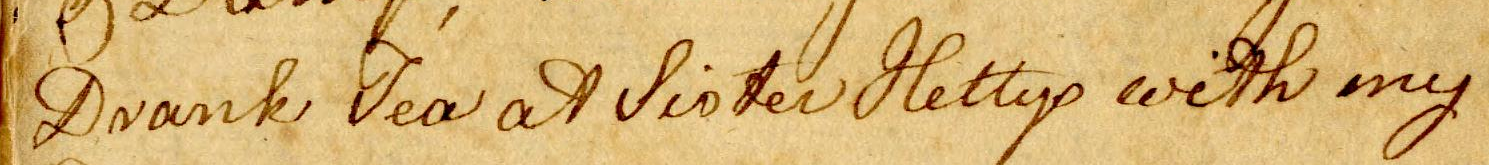Drank Tea at Sister Hettys with my
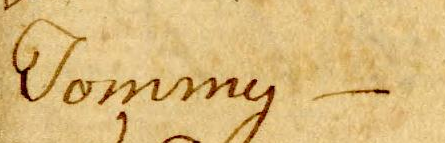Tommy-
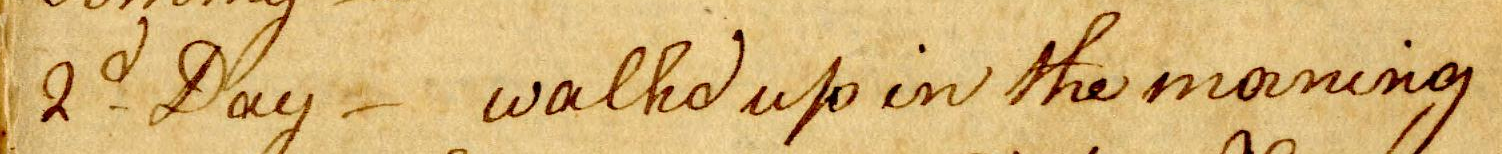2^d Day- walkd up in the morning
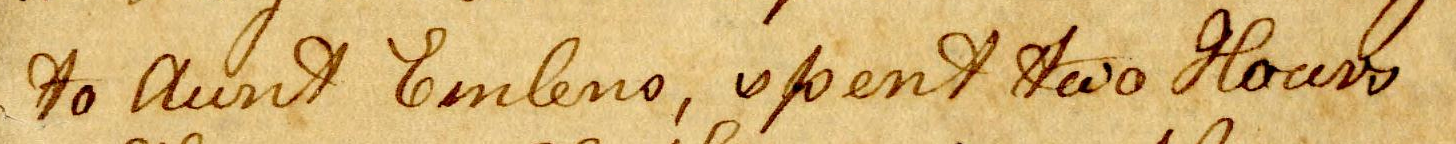to Aunt Emlens, spent two Hours
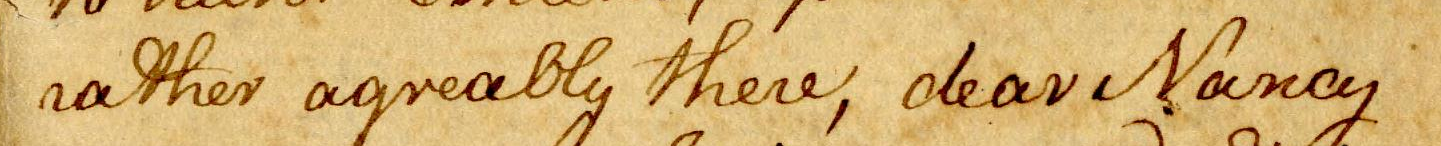rather agreably there, dear Nancy
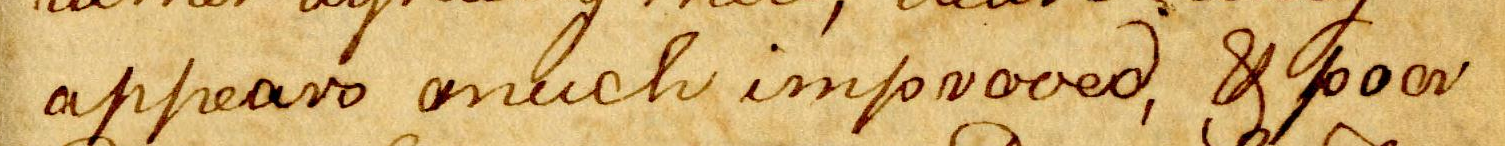appears much improved, & poor
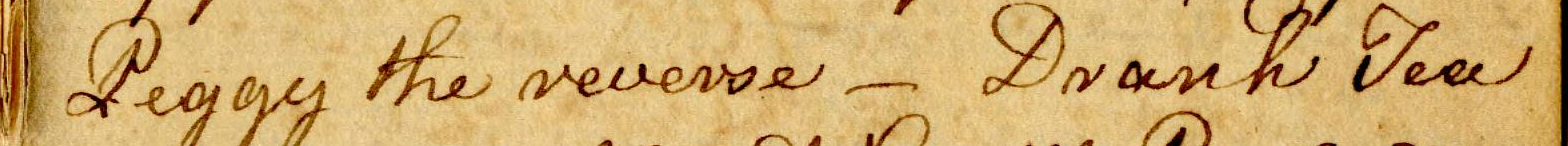Peggy the reverse- Drank Tea
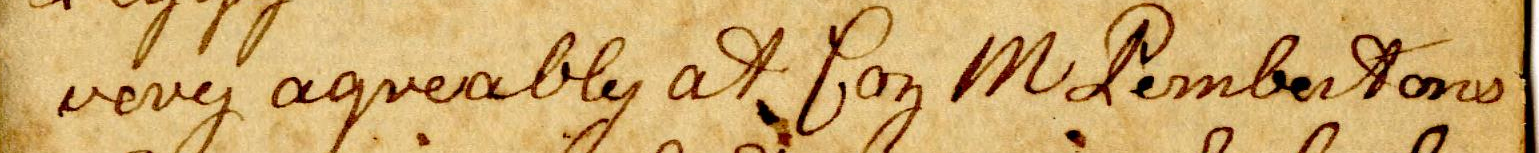very agreably at Coz M Pembertons
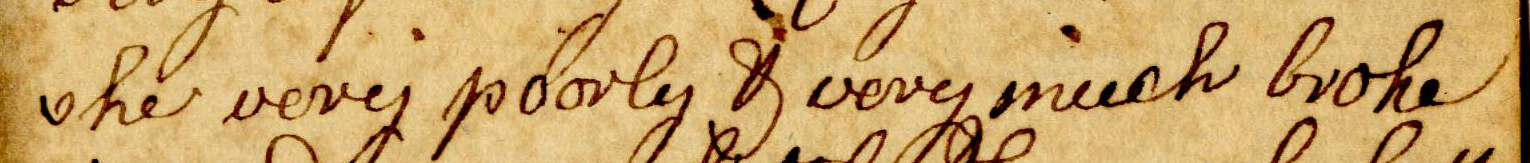she very poorly & very much broke
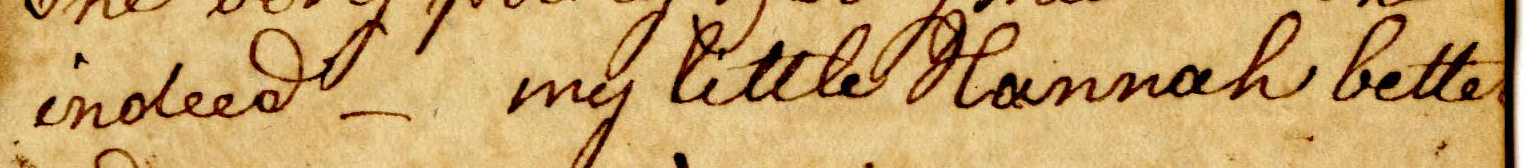indeed- my little Hannah bette
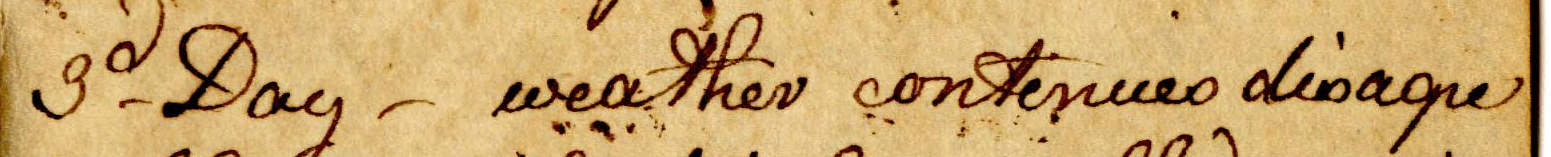3^d Day- weather continues disagre
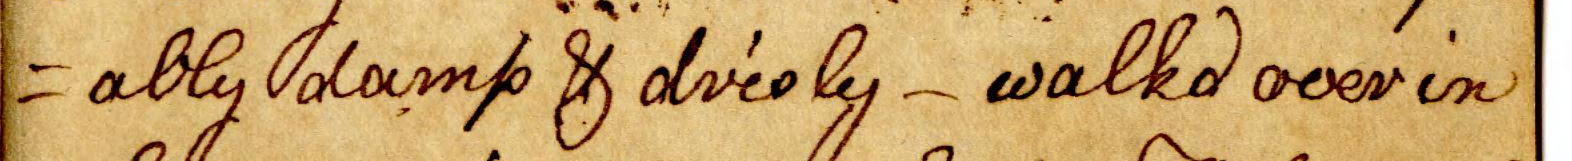-ably damp & drisly- walkd over in
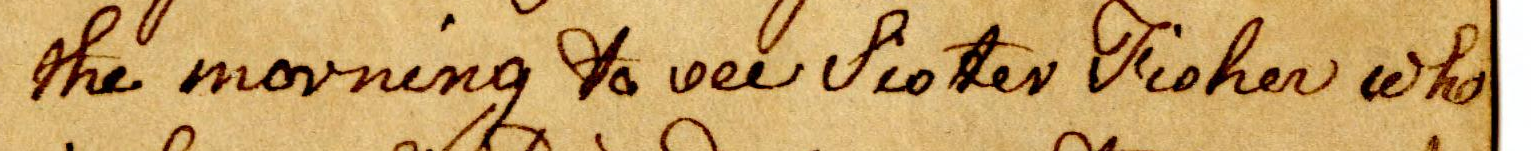the morning to see Sister Fisher who
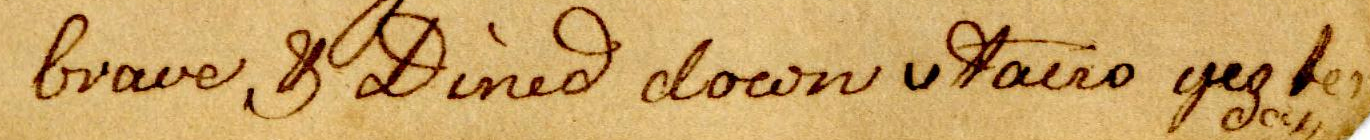brave & Dined down stairs yester
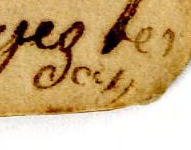day
